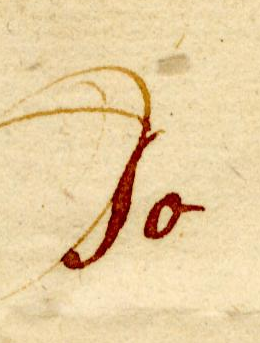To
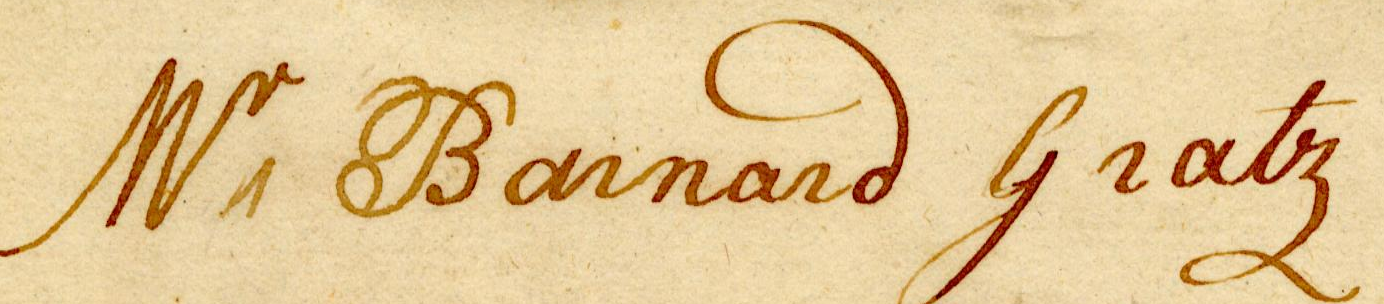M^r Barnard Gratz
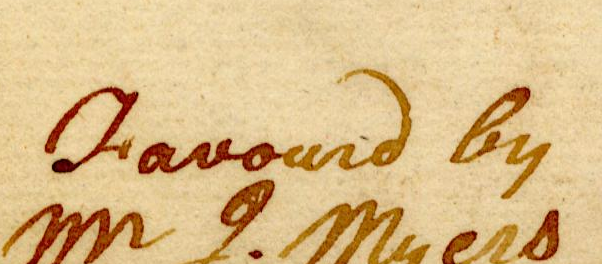Favourd by
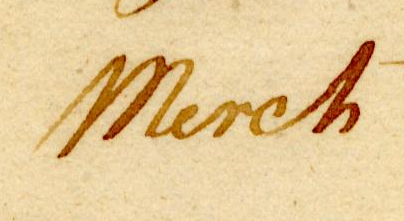Merch^t
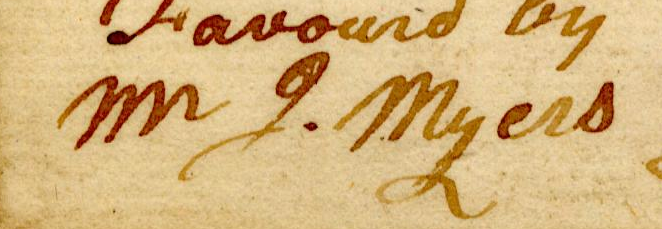M G Myers
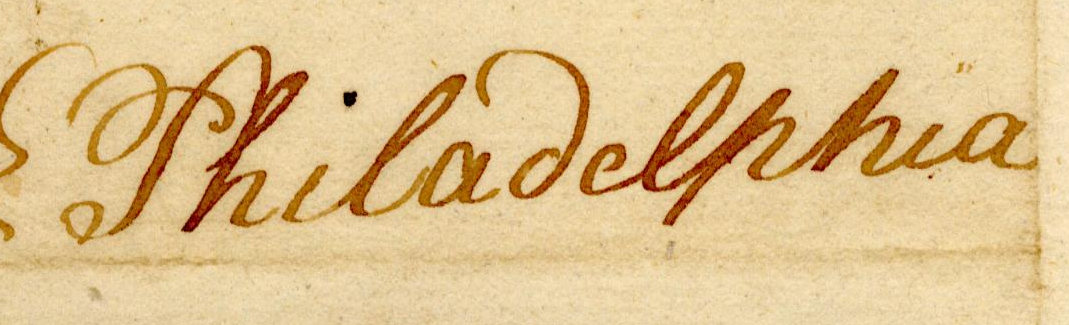Philadelphia
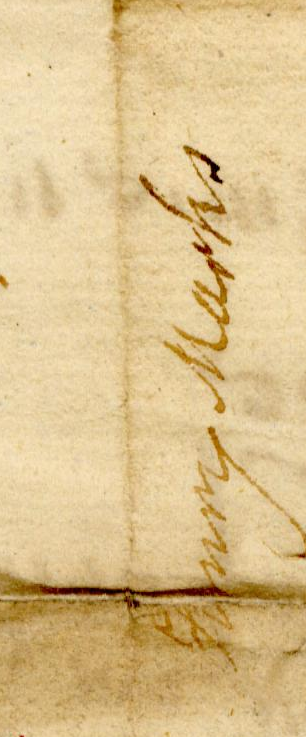Framing Marks
